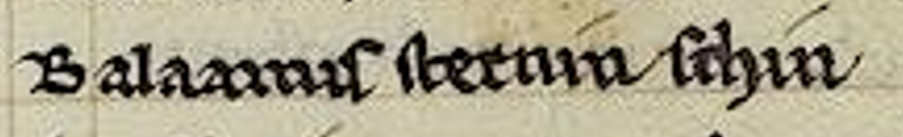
Balaamiſ ſternin ſchin.
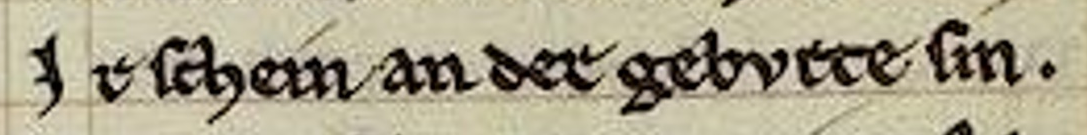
Ir ſchein an der gebvrte ſin.
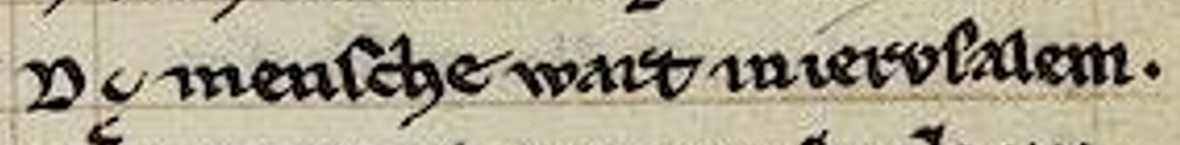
D(az) menſche wart in iervſalem.
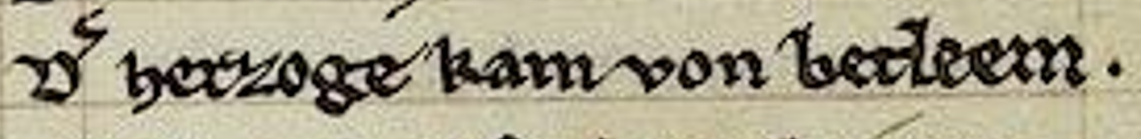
D(er) herzoge kam von betleem.
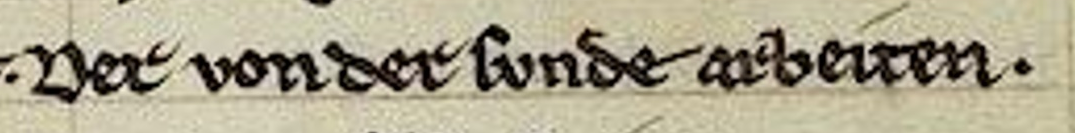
Der von der ſvnde arbeiten.
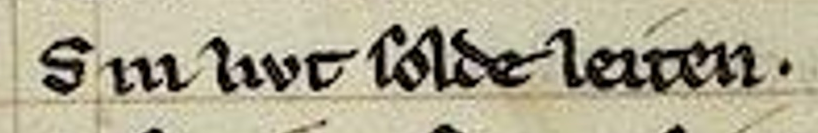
Sin livt ſolde leiten.
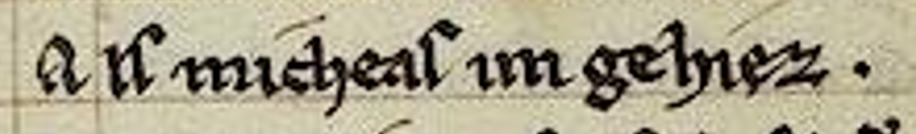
Alſ micheaſ im gehiez.
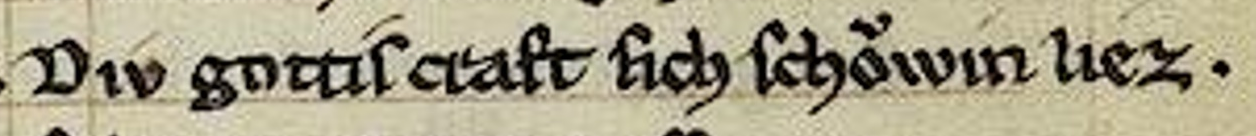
Div gottiſ craft ſich ſcho°vwin liez.
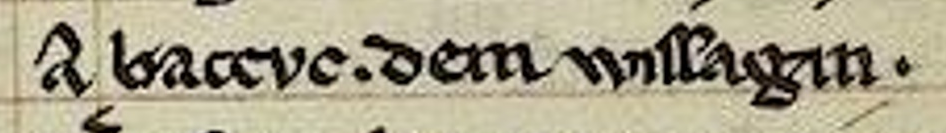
Abaccuc. Dem wiſſagin.
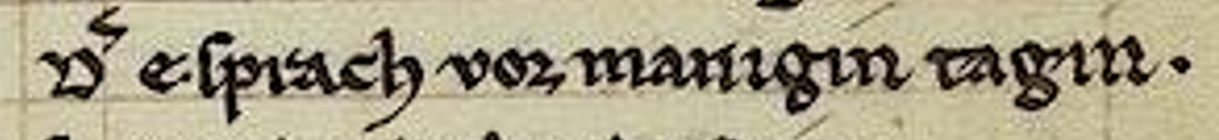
D(er) e ſprach vor manigin tagin.
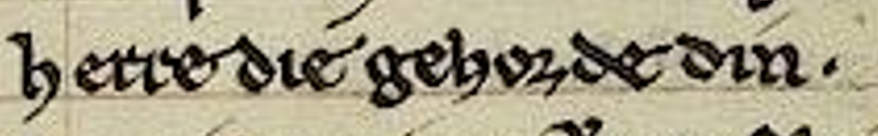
Herre die gehorde din.
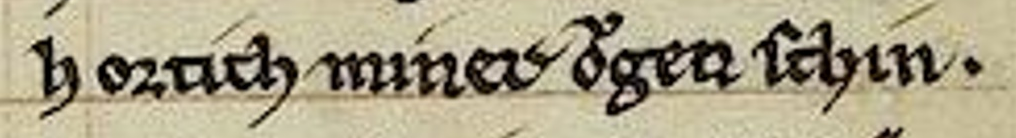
Hortich miner o°vgen ſchin.
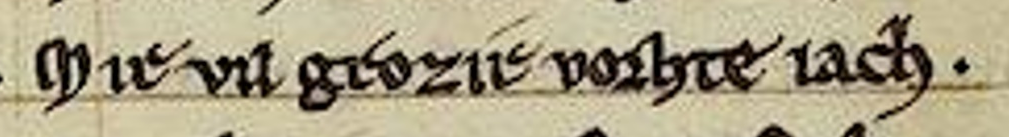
Mir vil grozir vorhte iach.
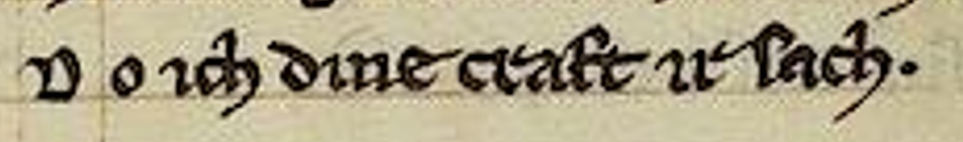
Do ich dine craft ir ſach.
